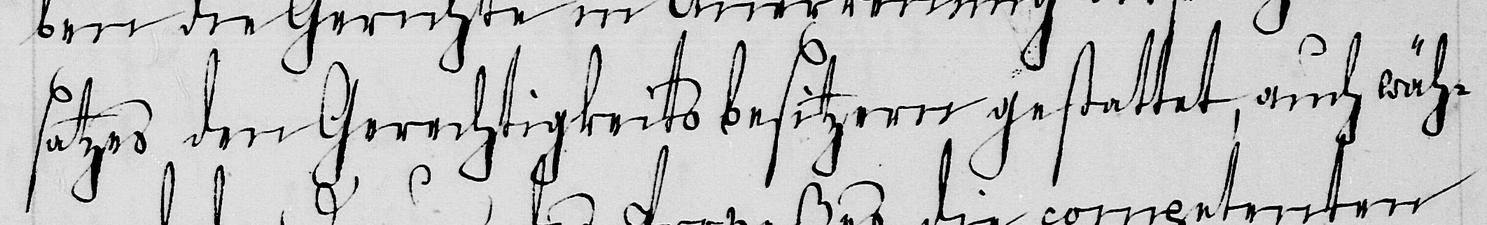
satzes den Gerechtigkeitsbesitzern gestattet, auch wäh¬
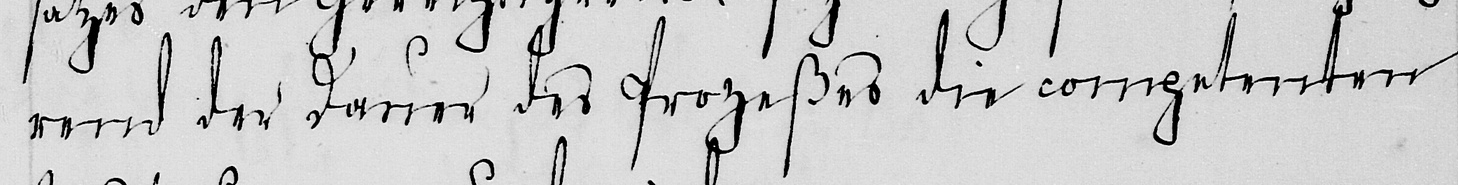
rend der Dauer des Prozeßes die competenten
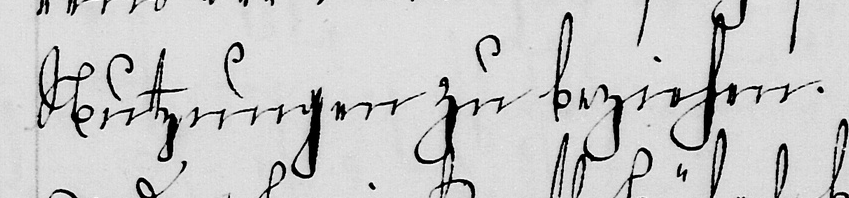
Nutzungen zu beziehen.
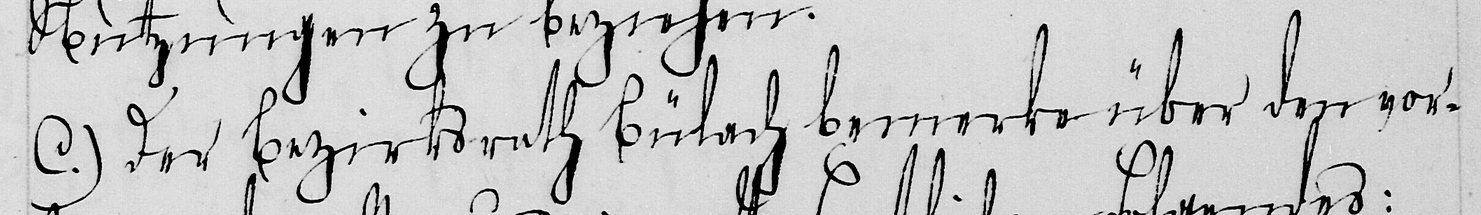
C.) Der Bezirksrath Bülach bemerke über den vor¬
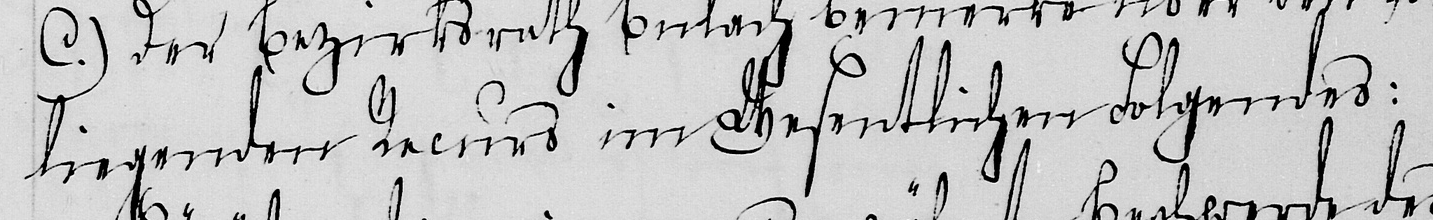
liegenden Recurs im Wesentlichen Folgendes:
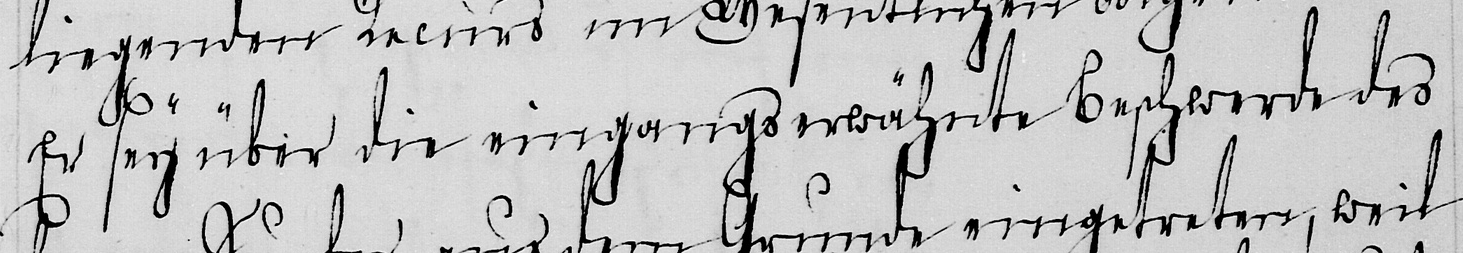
Er sey über die eingangs erwähnte Beschwerde des
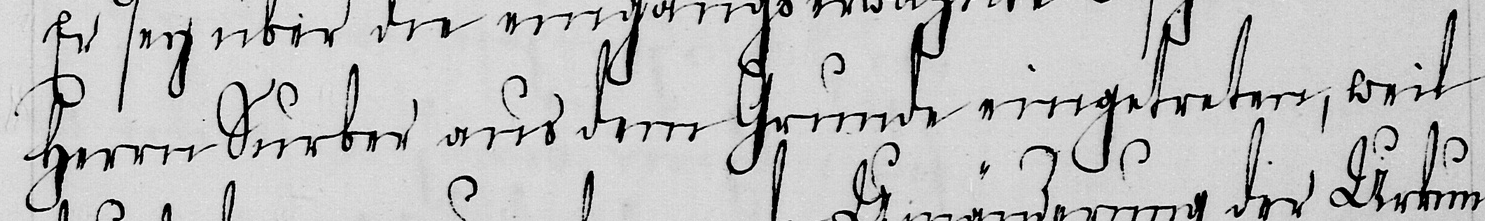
Herrn Surber aus dem Grunde eingetreten, weil
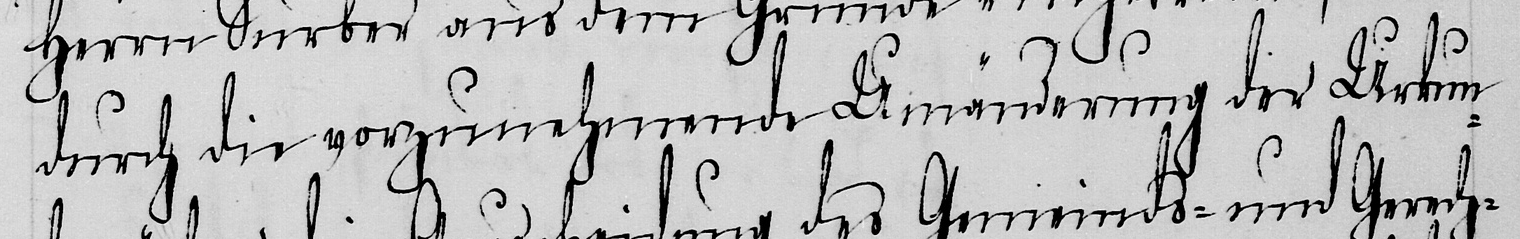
durch die vorzunehmende Umänderung der Urkun¬
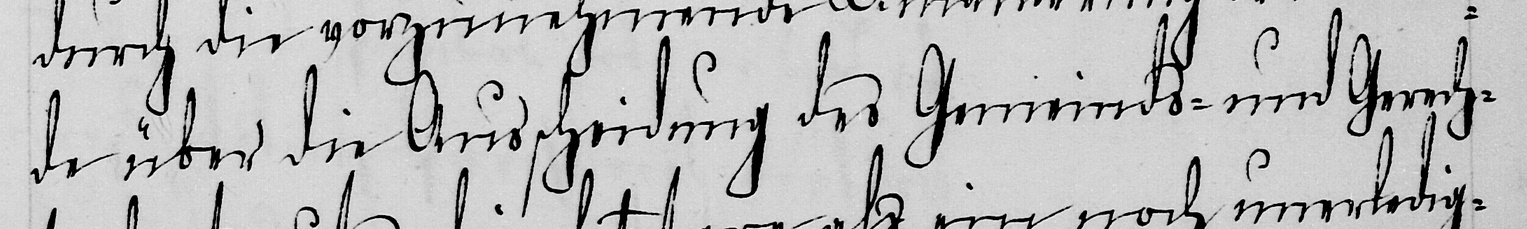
de über die Ausscheidung des Gemeinds- und Gerech¬
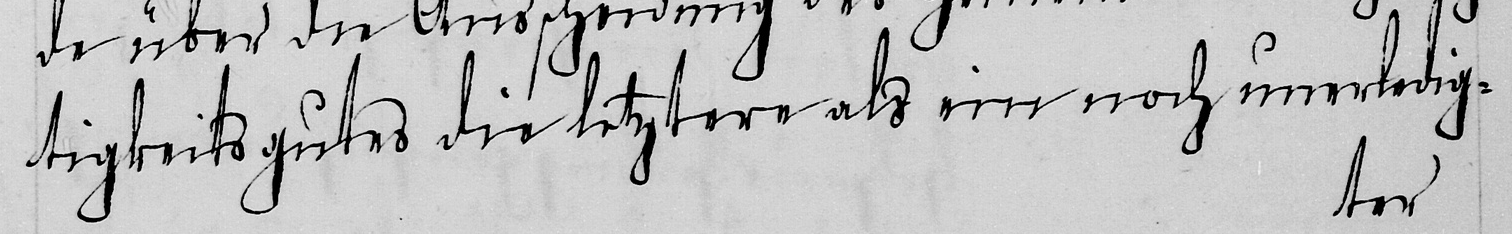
tigkeitsgutes die letztere als ein noch unerledig-
